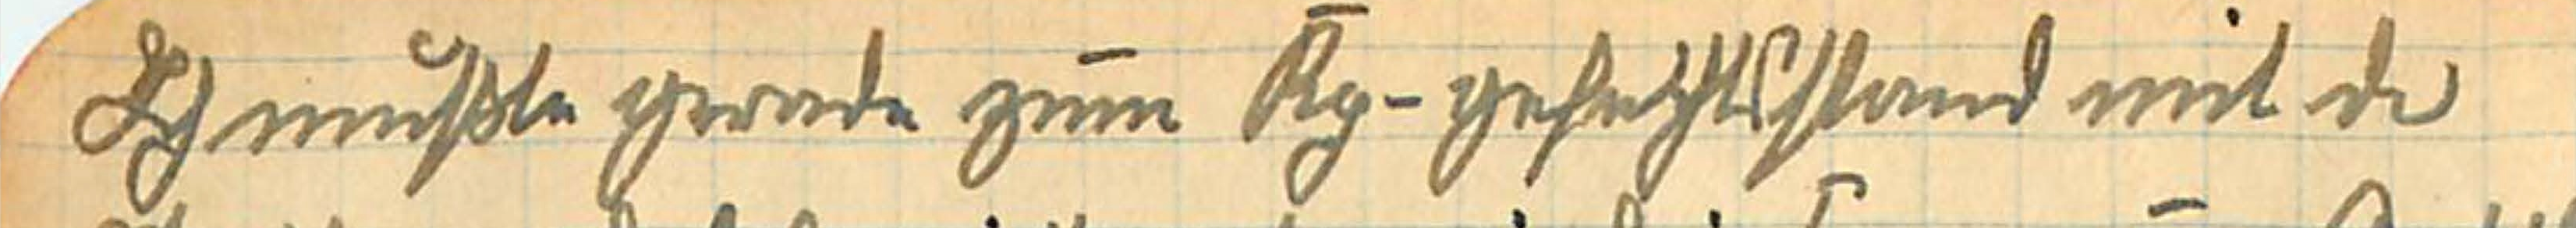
Ich mußte gerade zum Kp-gefechtsstand mit der
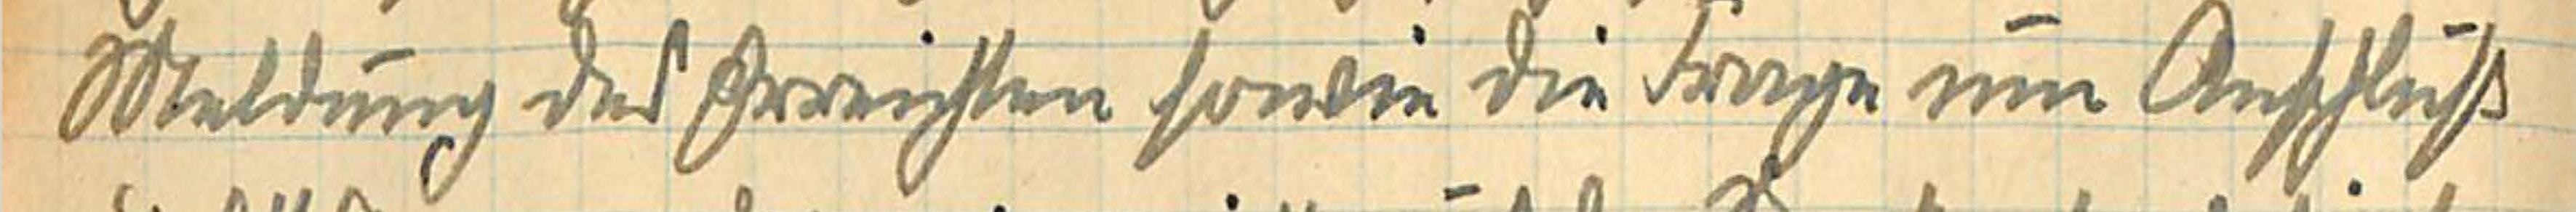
Meldung des Erreichten sowie die Frage um Anschluß
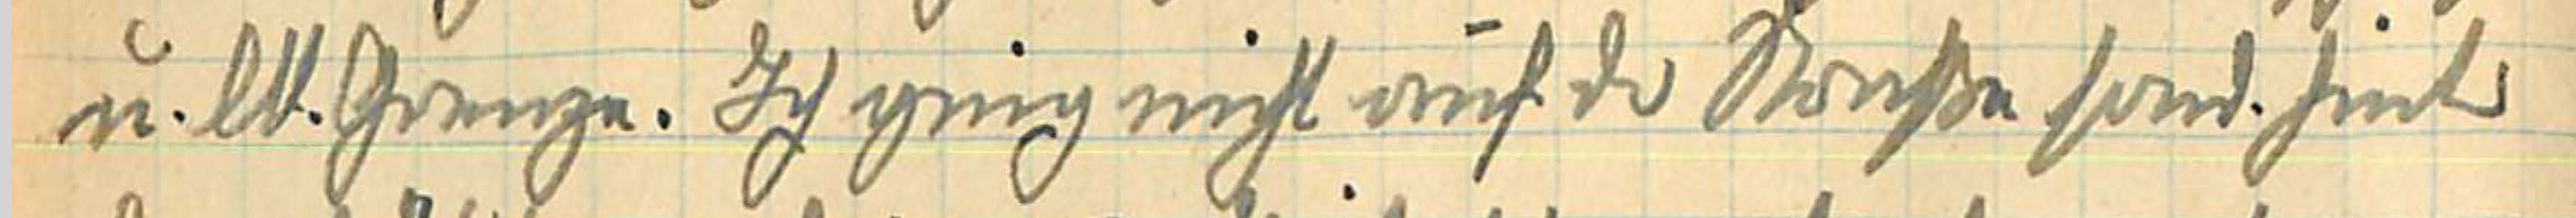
u. lk. Grenze. Ich ging nicht auf der Straße sond. hinter
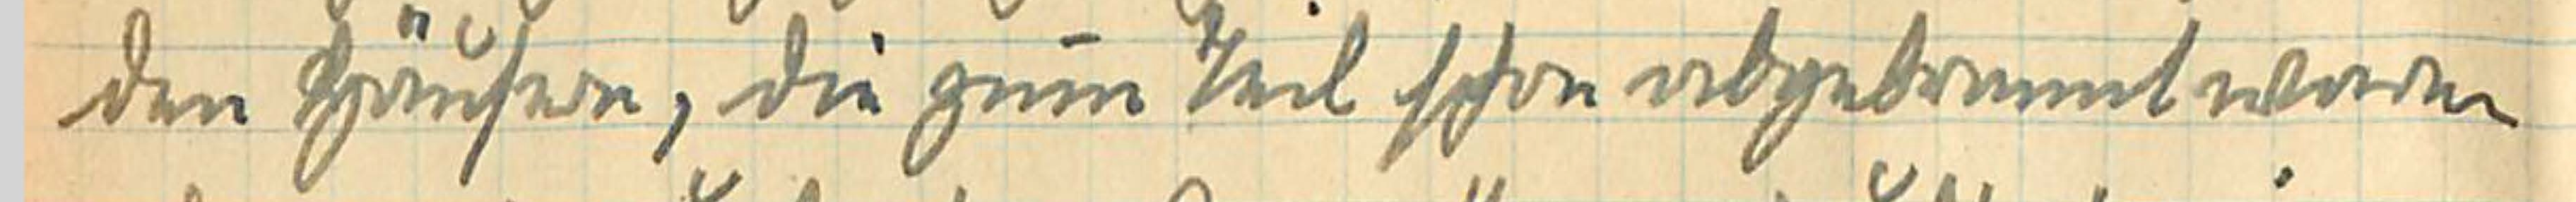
den Häusern, die zum Teil schon abgebrannt waren
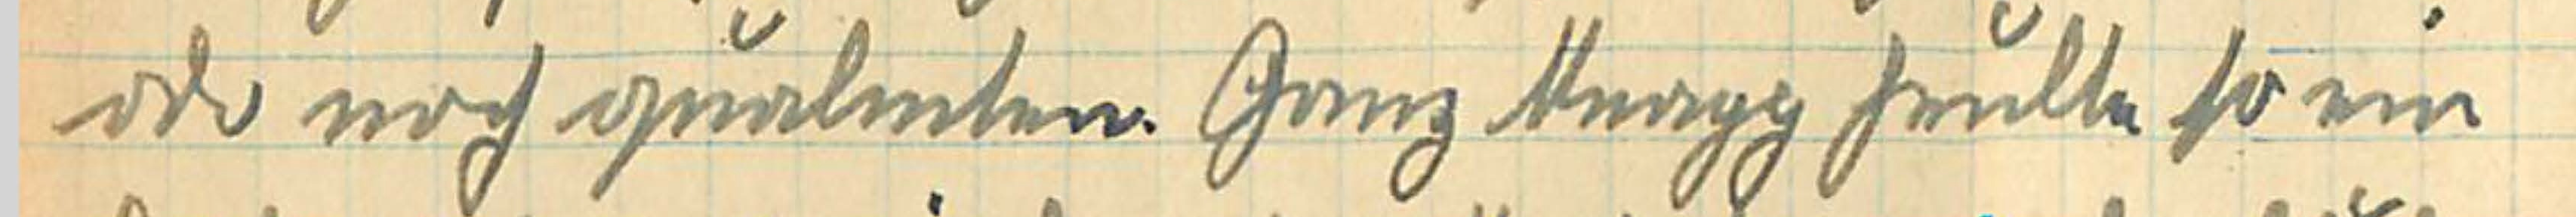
oder noch qualmten. Ganz knapp heulte so ein
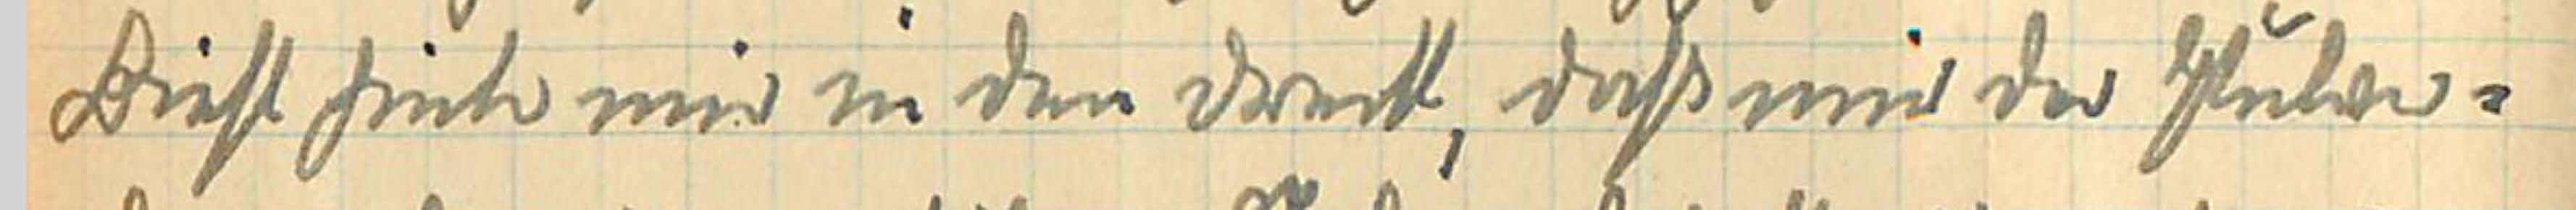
Biest hinter mir in den Dreck, daß mir der Pulver-
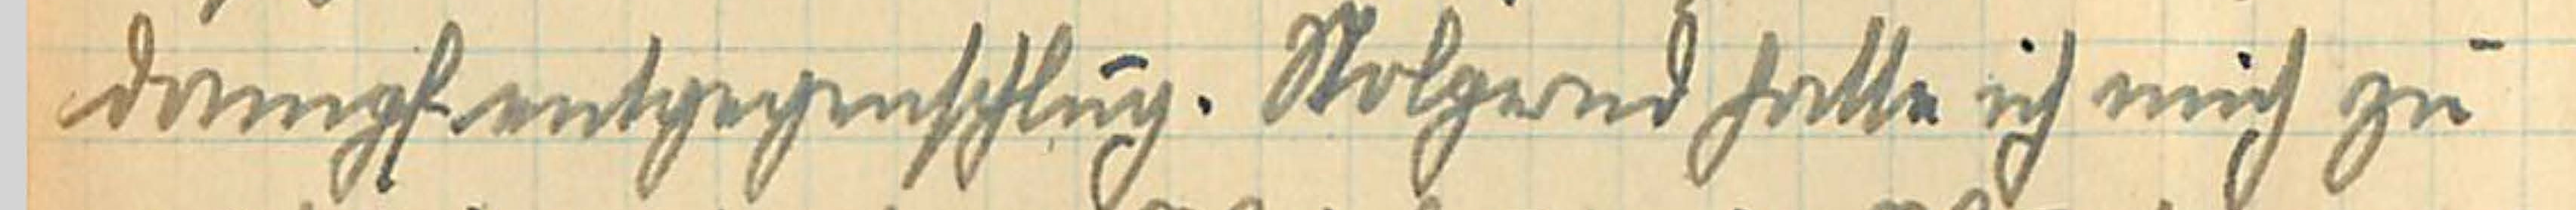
dampf entgegenschlug. Stolpernd hatte ich mich zu
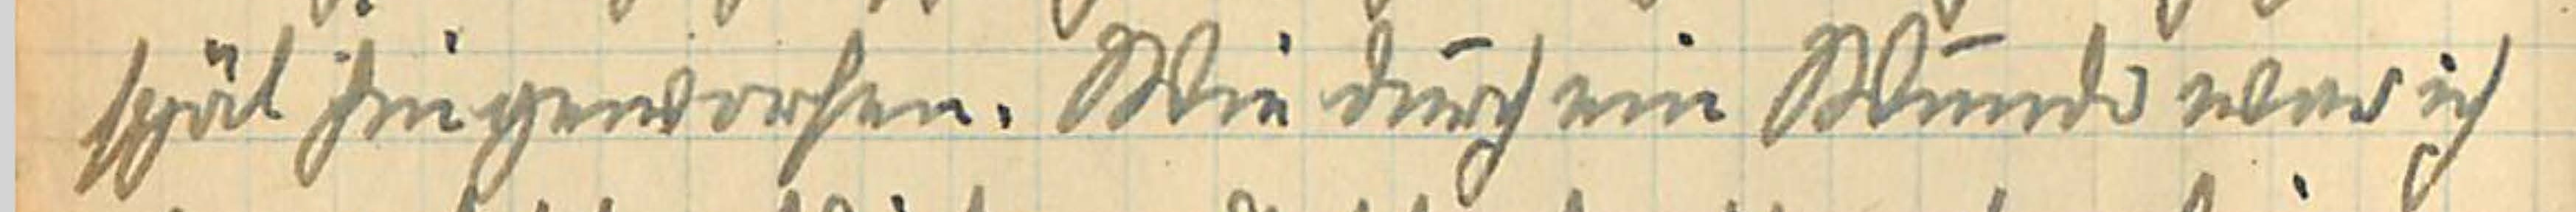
spät hingeworfen. Wie durch ein Wunder war ich
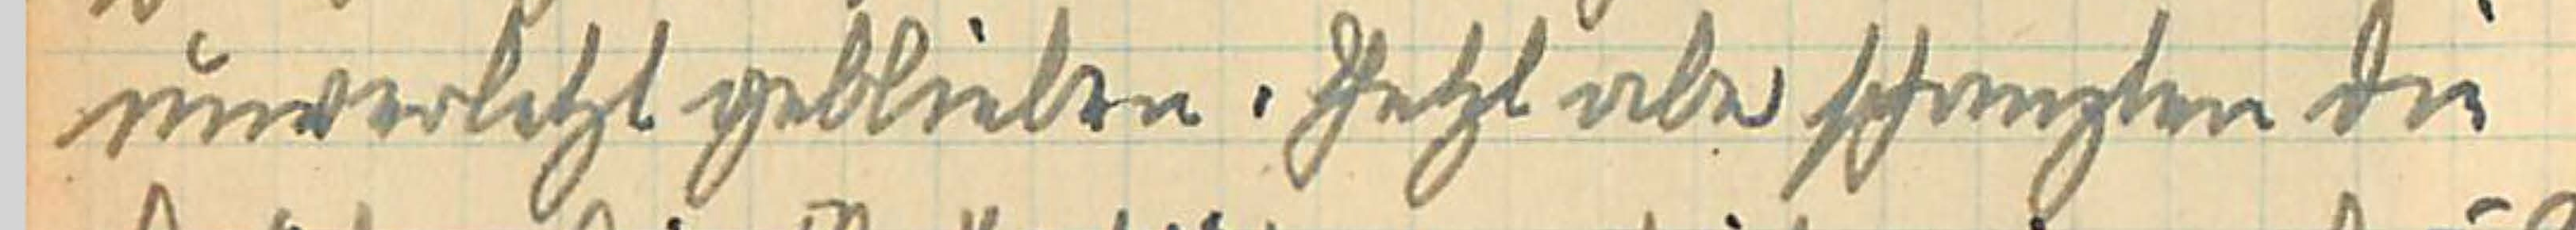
unverletzt geblieben. Jetzt aber schanzten die
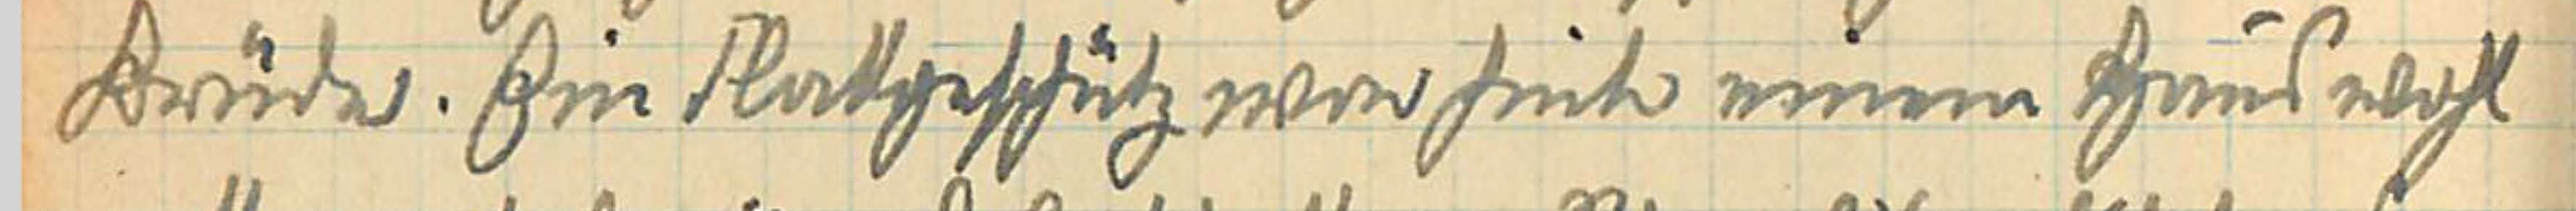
Brüder. Ein Flakgeschütz war hinter einem Haus wohl
